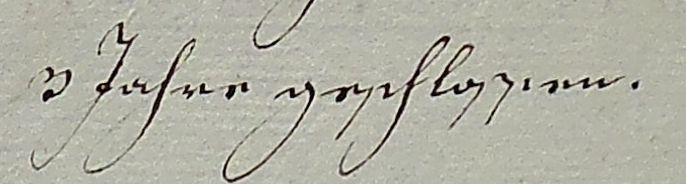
3 Jahre geschlossen.
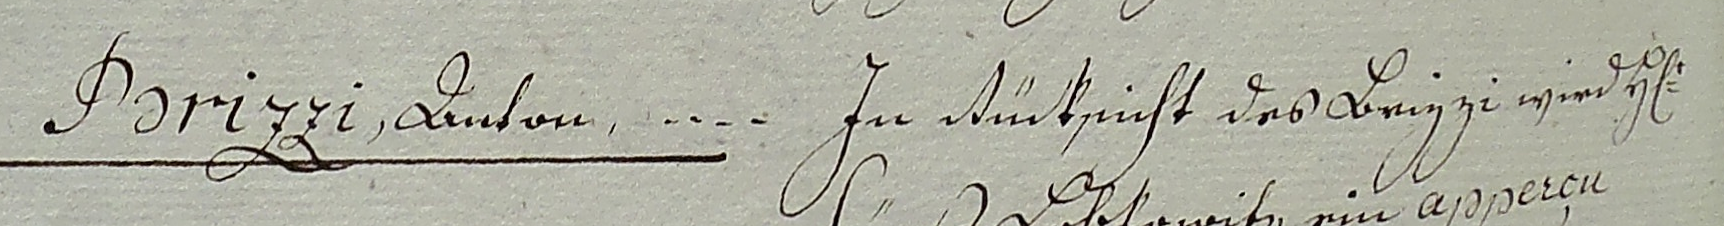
Brizzi, Anton, .... In Rücksicht des Brizzi wird HEr͇
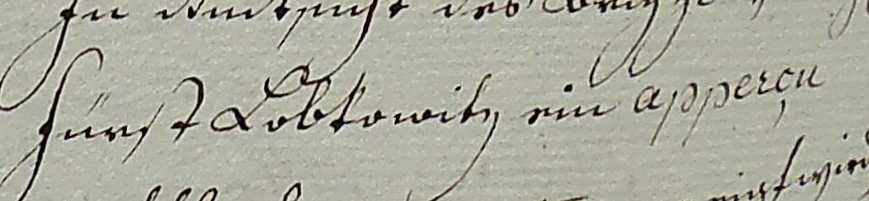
Fürst Lobkowitz ein appercu
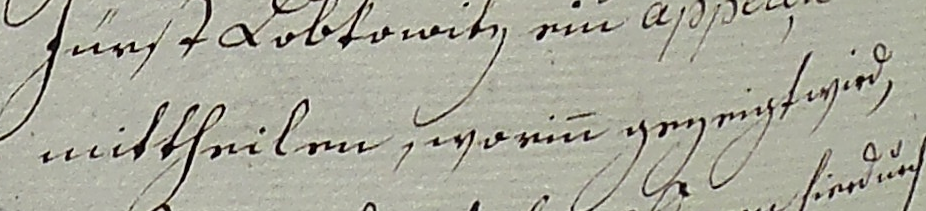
mittheilen, worin̅ gezeigt wird,
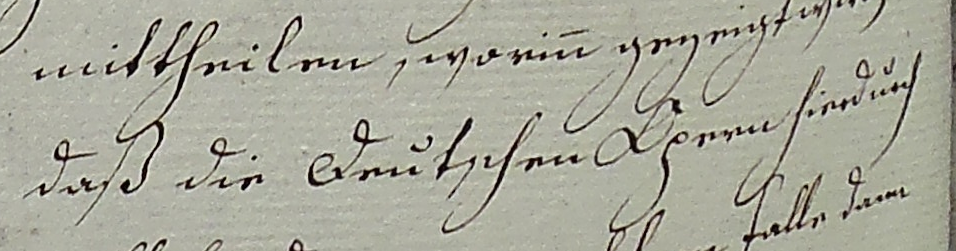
daß die Deutschen Opern hierdurch
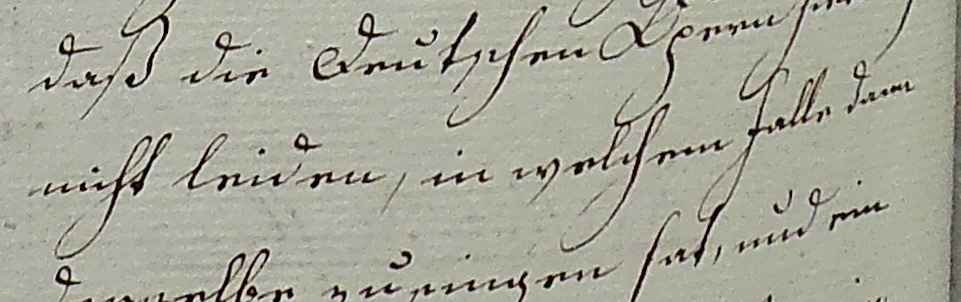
nicht leiden, in welchem Falle dann
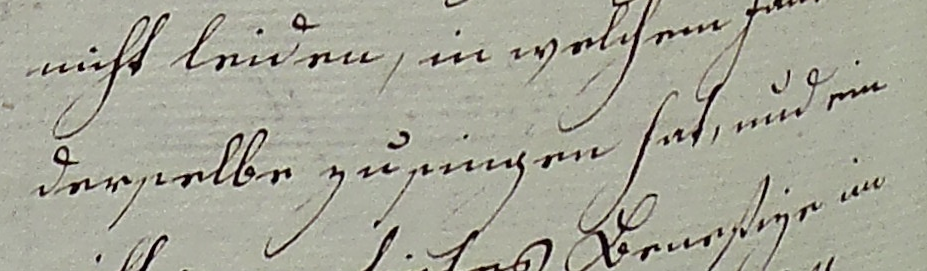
derselbe zusingen hat, und ein
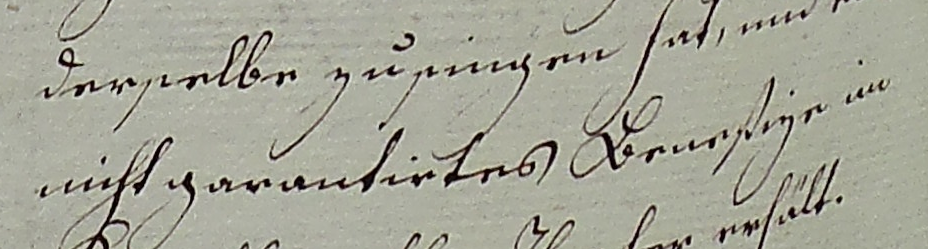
nicht garantirtes Benefize im
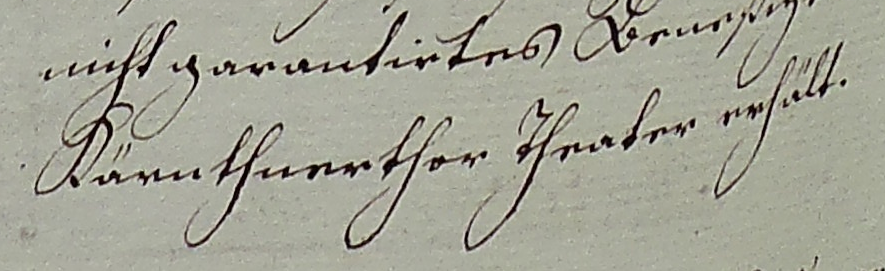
Kärnthnerthor Theater erhält.
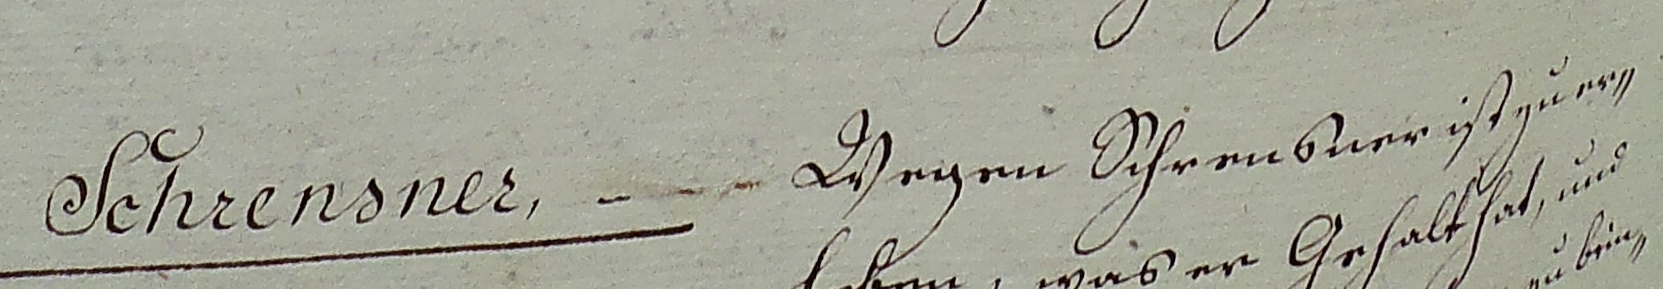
Schrensner, .. .. .. Wegen Schrensner ist zu er¬
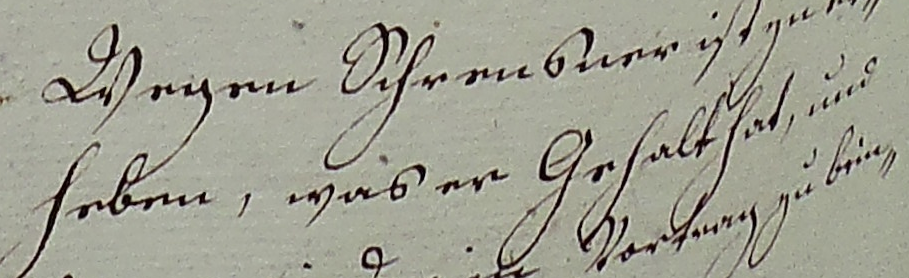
heben, was er Gehalt hat, und
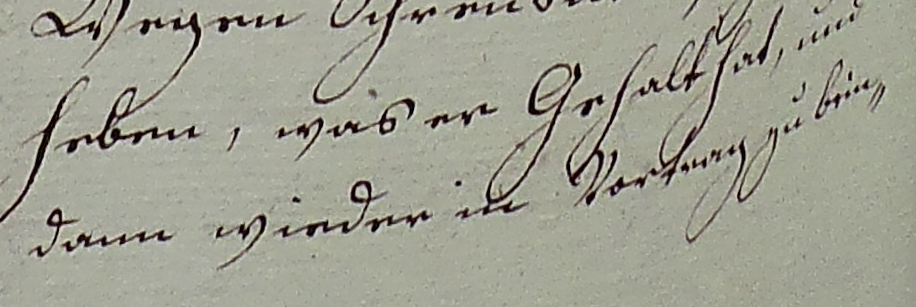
dann wieder in Vortrag zu brin¬
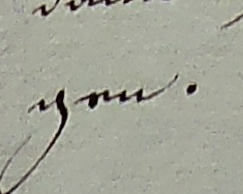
gen.
